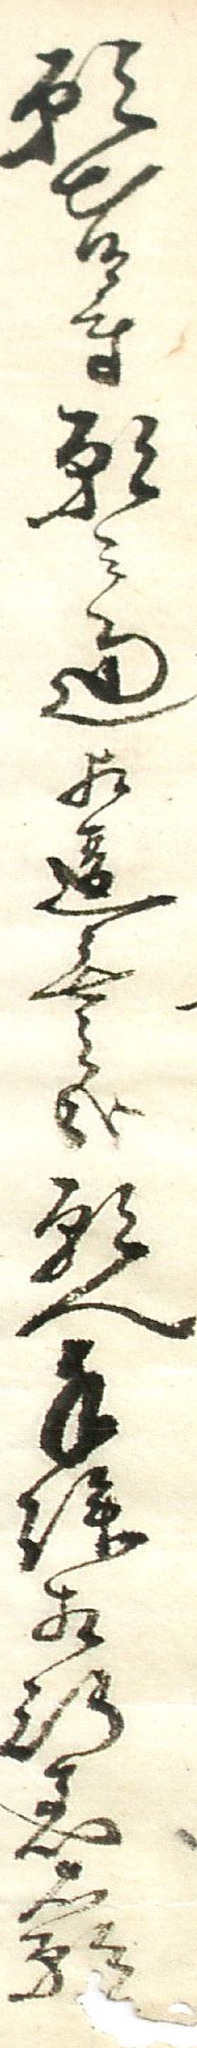願出候ニ付願之通相違無之哉願人手許相行着右願ニ
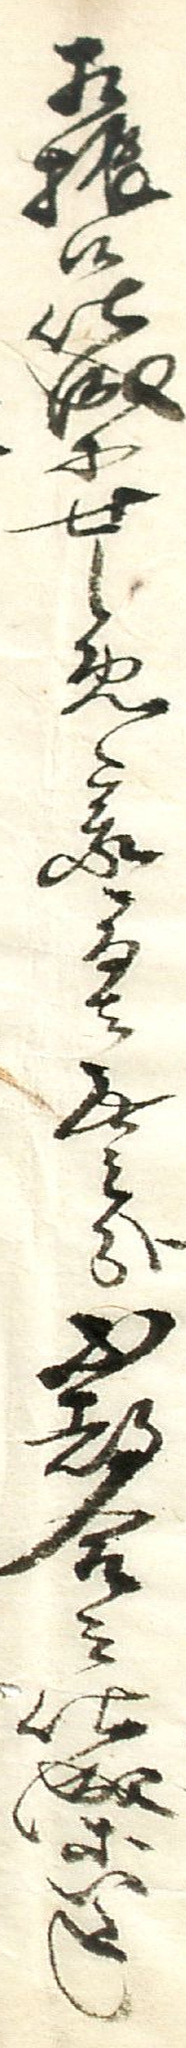相振候仕成等せしめ候義ニ而者無之哉不都合之仕成等いたし
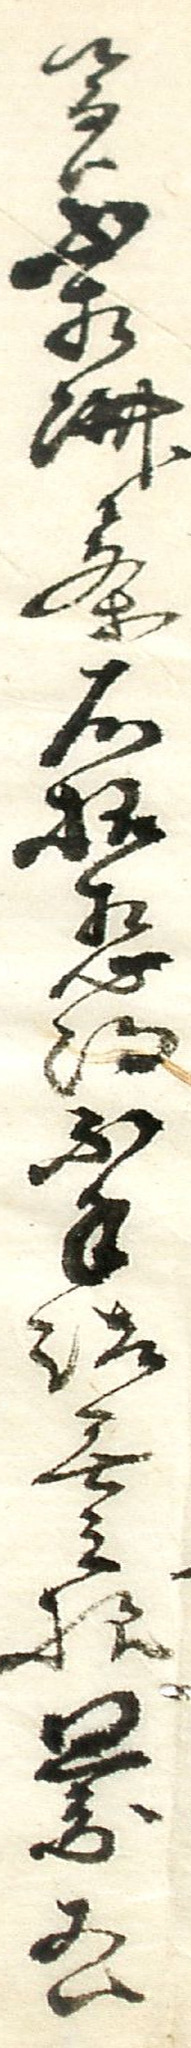候而ハ不相済候条右様相心得不手詰無之様且亦右
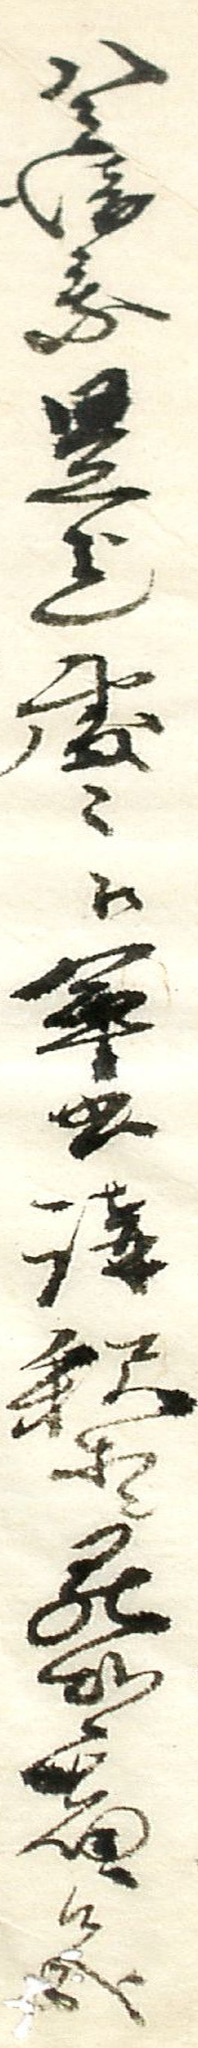八兵衛義是迄處々江軍書講釈等ニ罷出候者ニ候哉
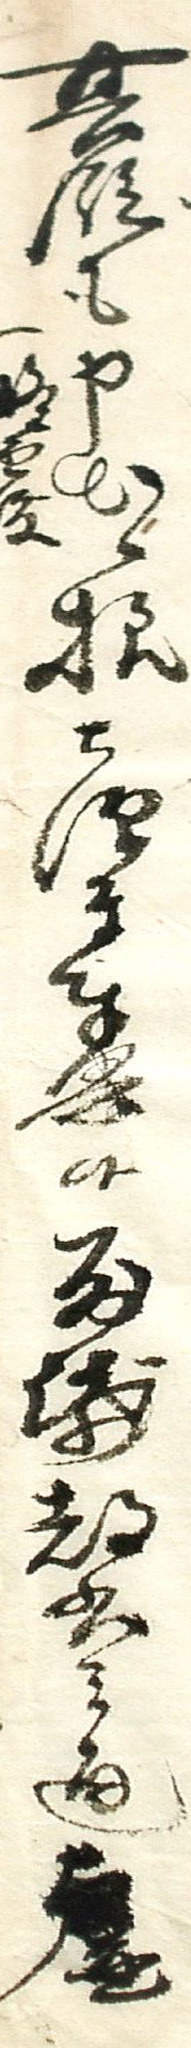其段も申出候様被仰付奉畏候別帋都書之通虚
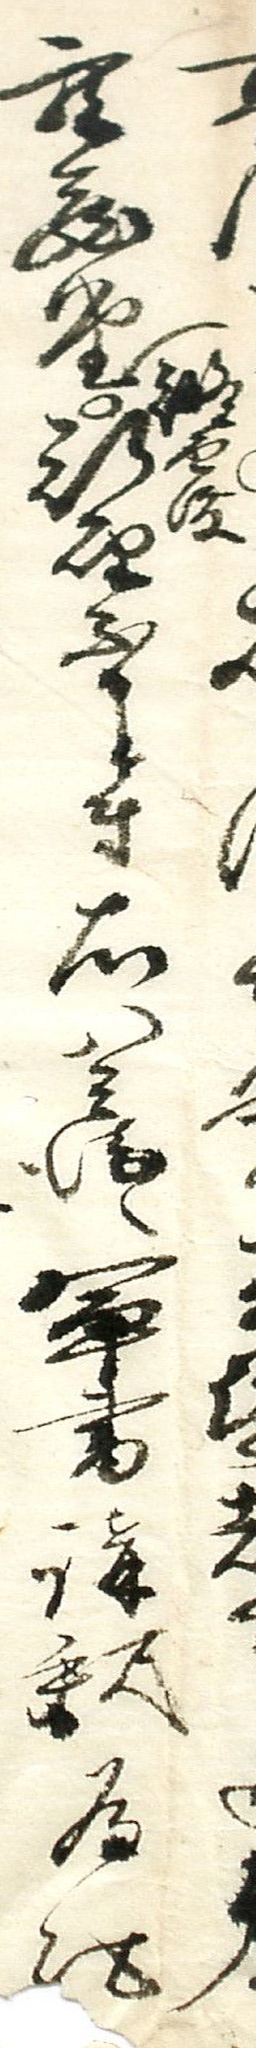空蔵堂○行届不申ニ付右八兵衛へ軍書講釈為仕
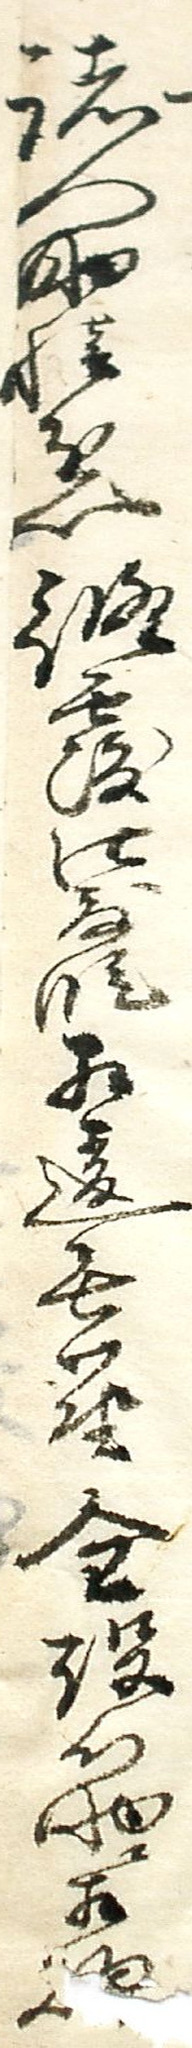諸人助情を以修覆仕度段相違無御坐候全役筋ニ相拘り
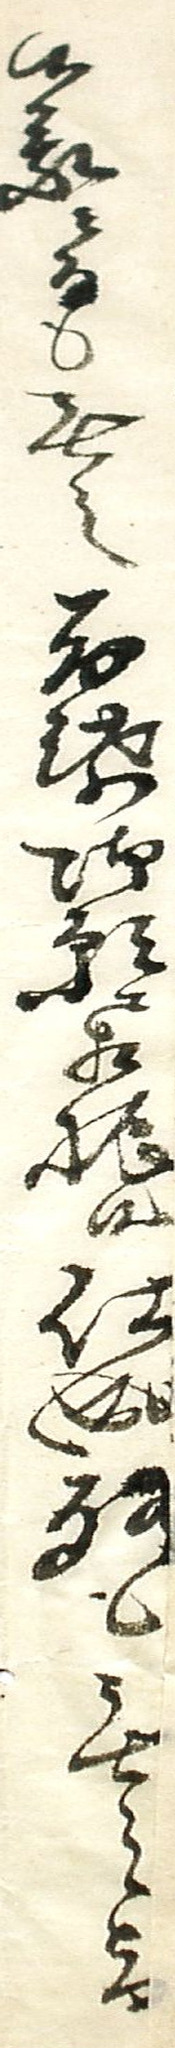候義ニ而も無之別帋御願ニ相振候仕成聊も無之旨
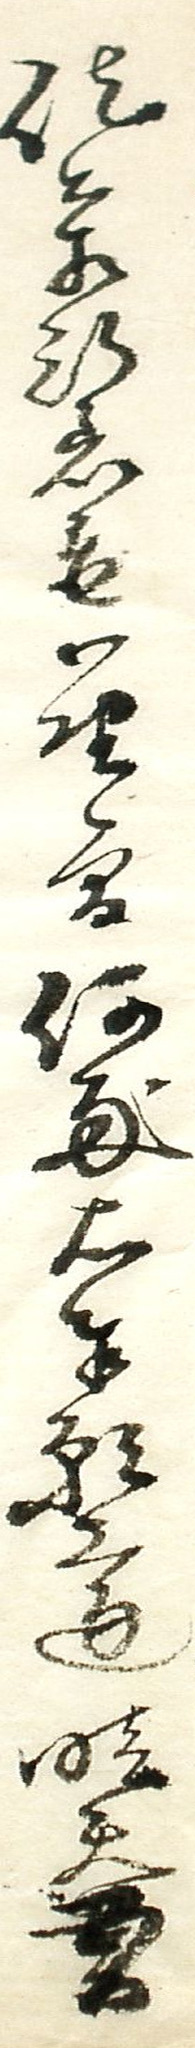屹と相行着置御坐候間何卒右奉願上通晴天五日
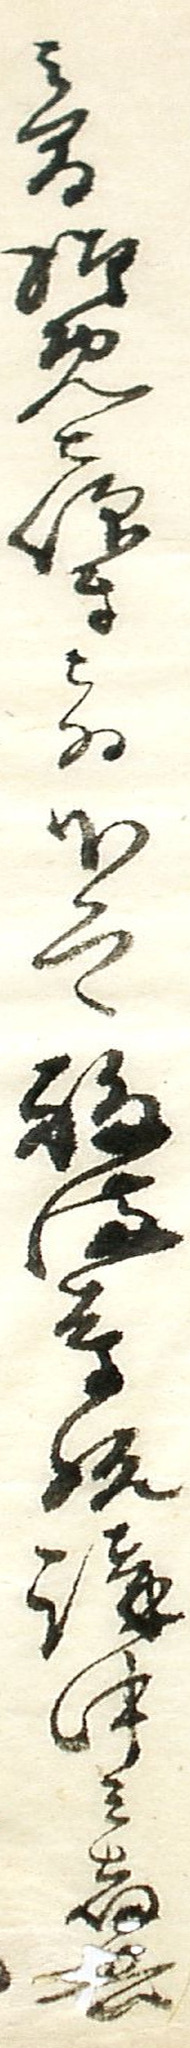之間御免被仰付被為下候ハヽ福満寺始講中之者共
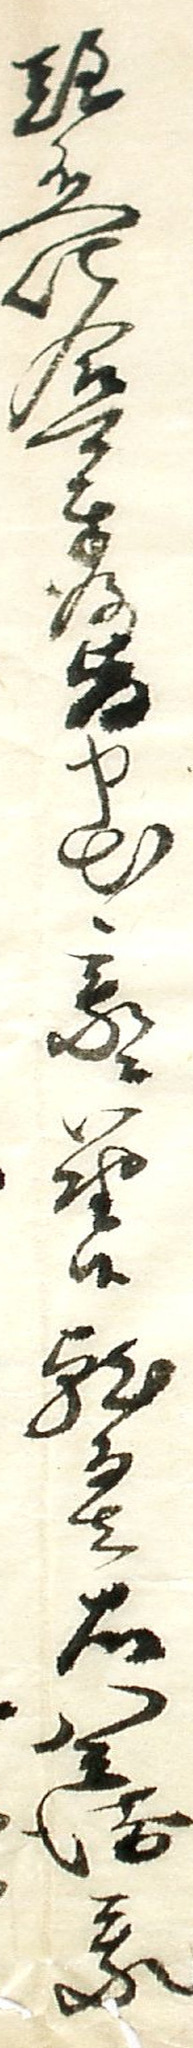難有仕合可奉存旨申出候義ニ御坐候就而者右八兵衛義
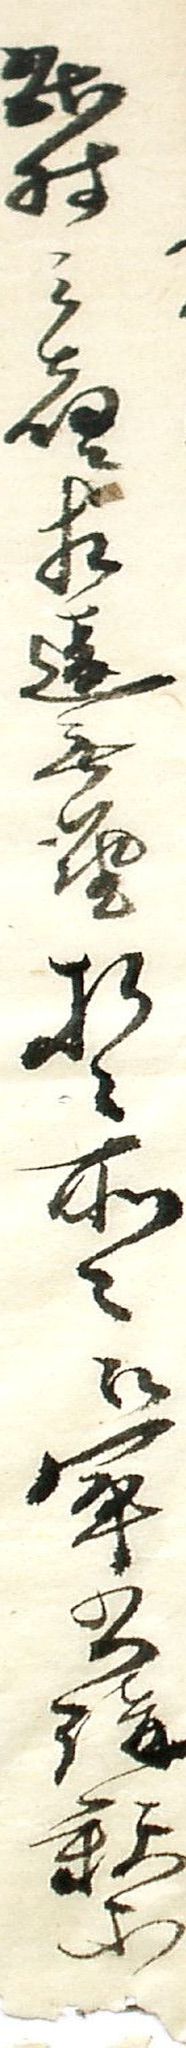當村之者ニ相違無御坐候折々所々江軍書講釈等
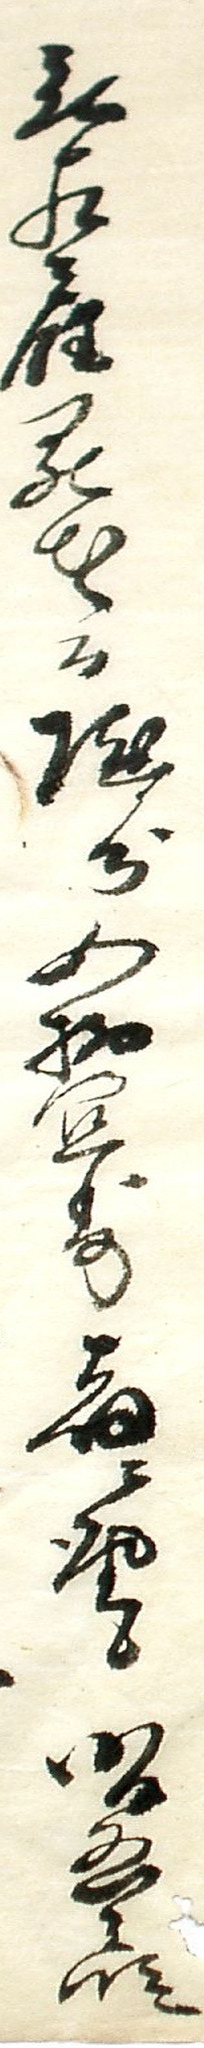被相雇罷出候而随分人柄宜布者ニ御坐候仍而右之段
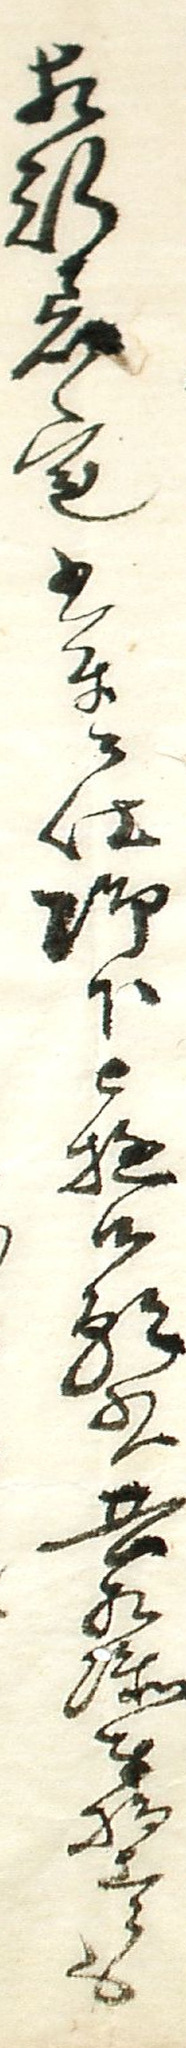相行着候運書付ニ仕御下被遊候願書共相添奉指上候以上
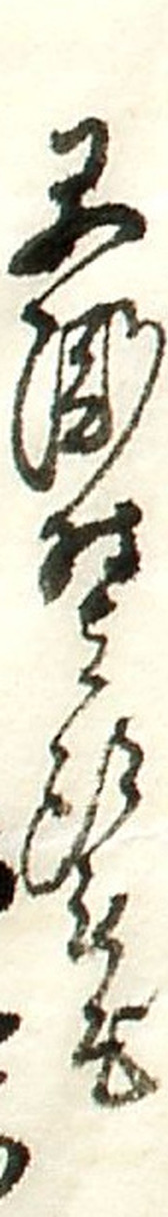早渕村与頭庄屋
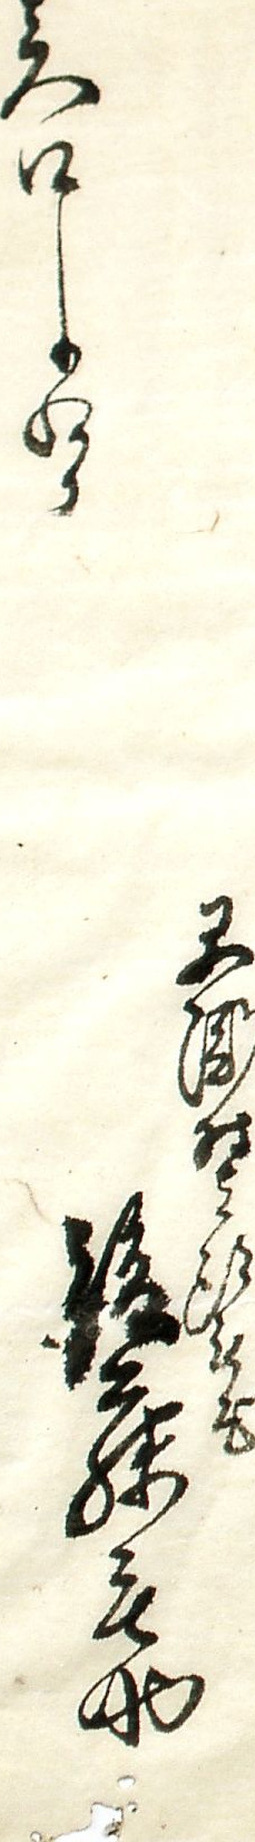亥四月九日後藤庄助
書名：（早渕村福満寺虚空蔵菩薩堂修復のためおどけ軍書講談願行着添え書控）
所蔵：鳴門教育大学 Naruto University of Education
